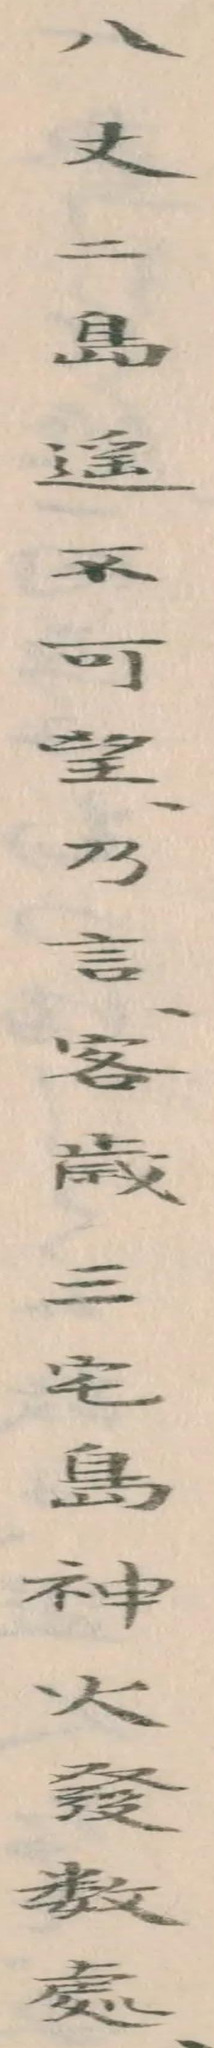八丈二島遥不可望、乃言、客歳三宅島神火発数処、
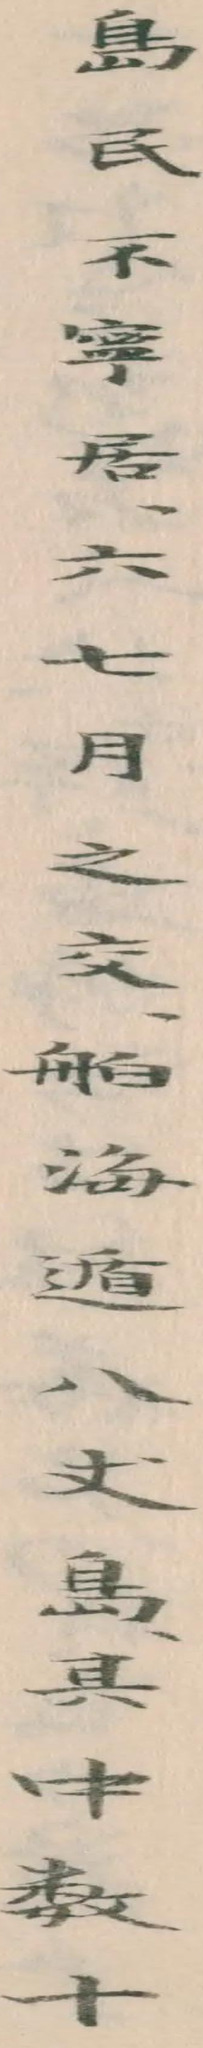島民不寧居、六七月之交、舶海遁八丈島、其中数十
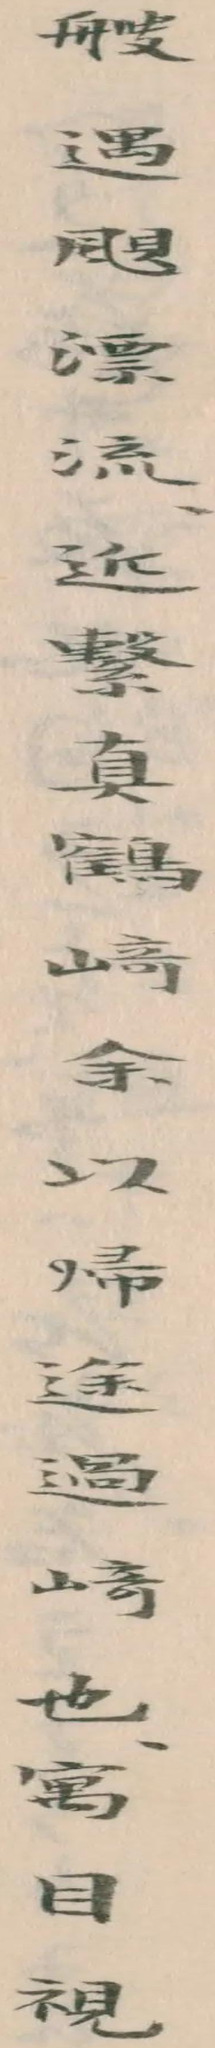艘遇颶漂流、近繫真鶴崎余以帰途過崎也、寓目視
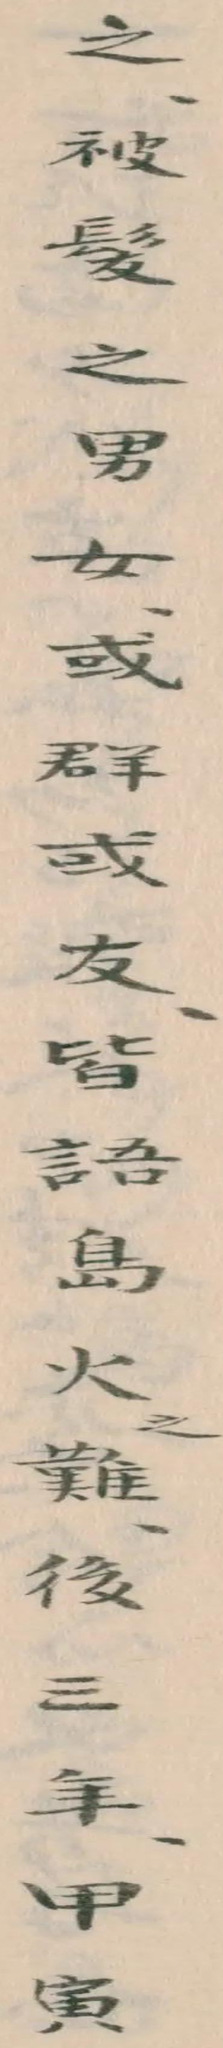之、被髪之男女、或群或友、皆語島火之難、後三年、甲寅
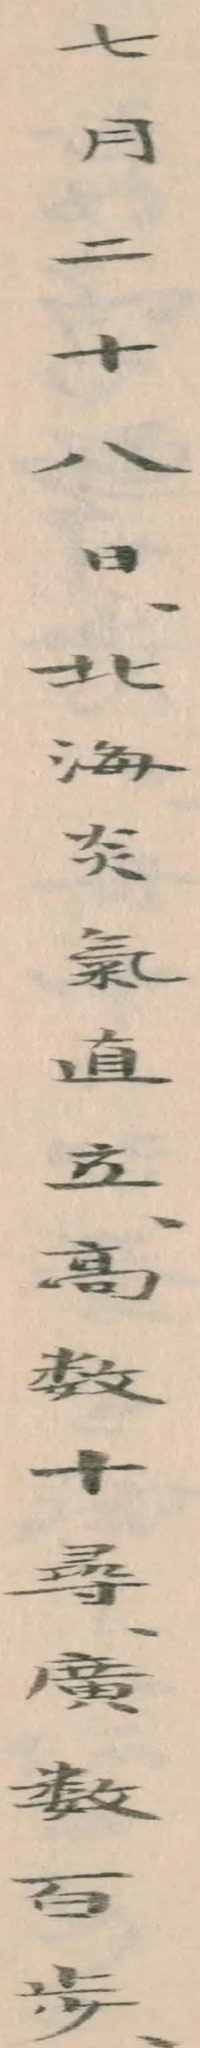七月二十八日、北海炎気直立、高数十尋、広数百歩、
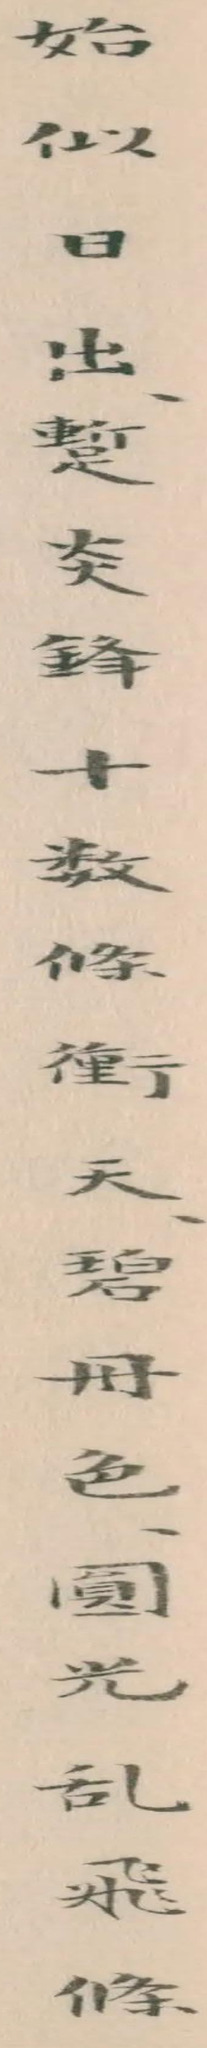始以日出、蹔炎鋒十数條衝天、碧丹色、円光乱飛條
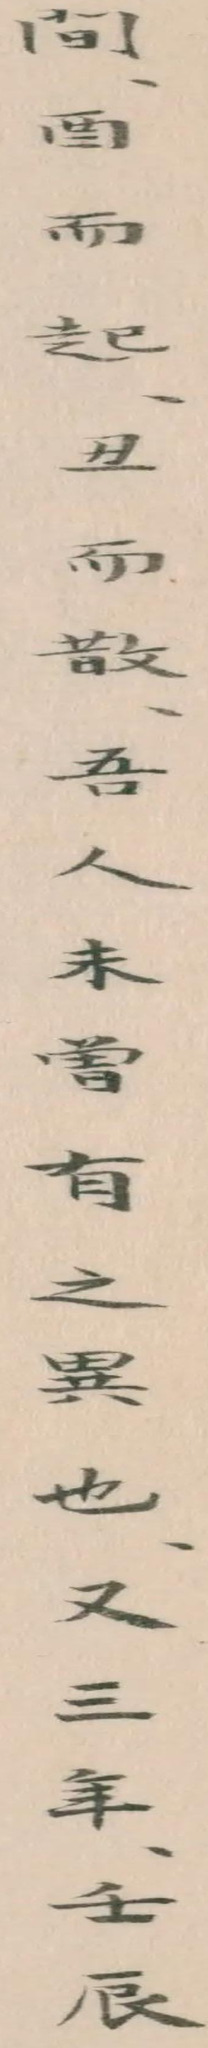間、酉而起、丑而散、吾人未曽有之異也、又三年、壬辰
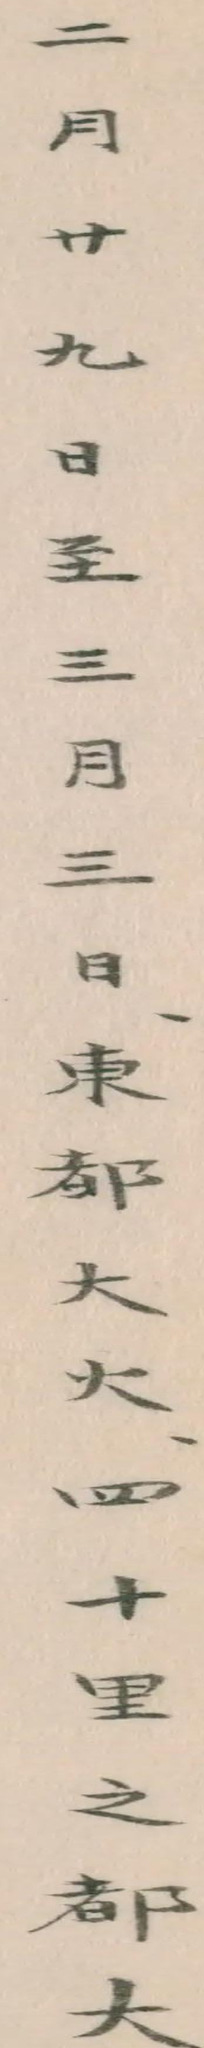二月廿九日至三月三日、東都大火、四十里之都大
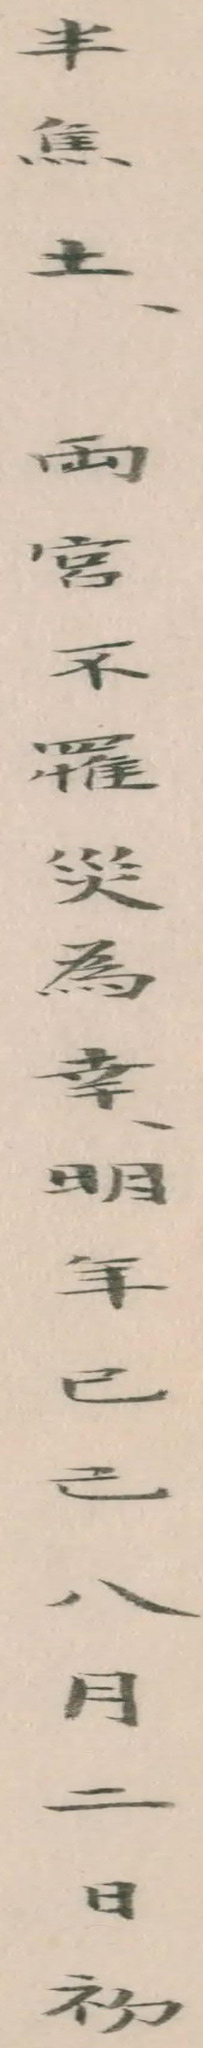半焦土、両宮不罹災為幸、明年己巳八月二日初
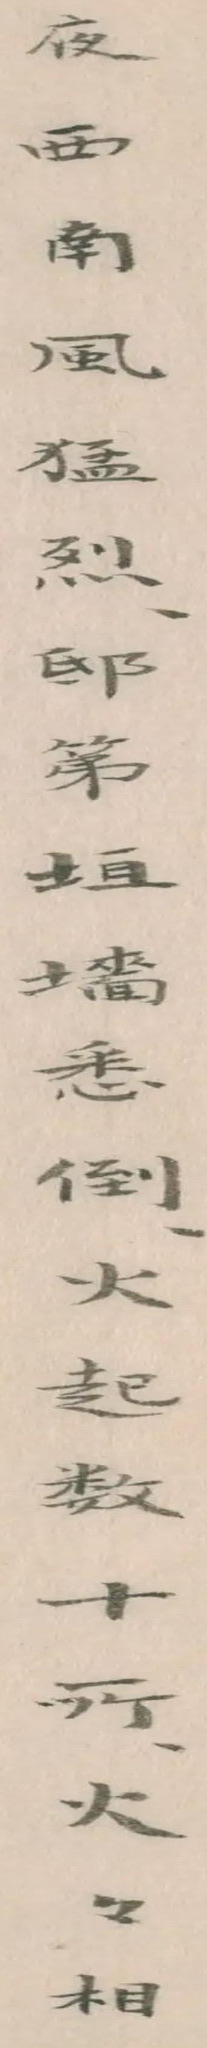夜西南風猛烈、邸第垣墻悉倒、火起数十所、火々相
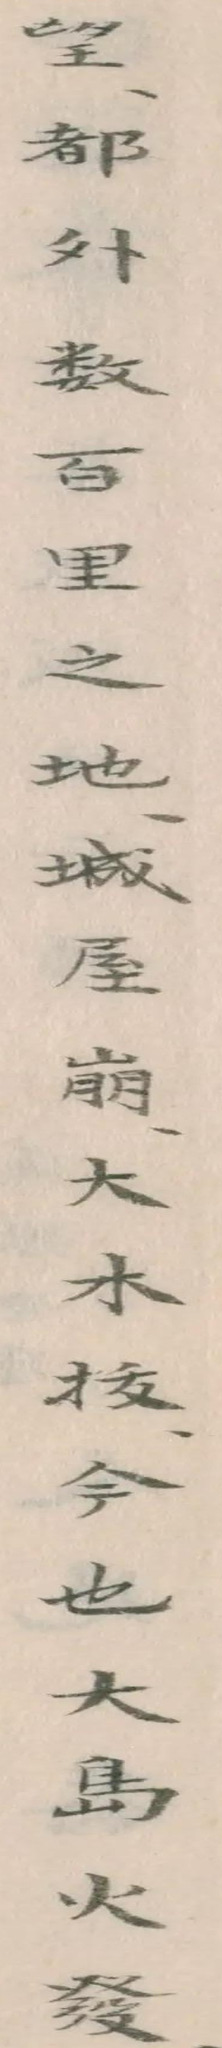望、都外数百里之地、城屋崩、大木抜、今也大島火発、
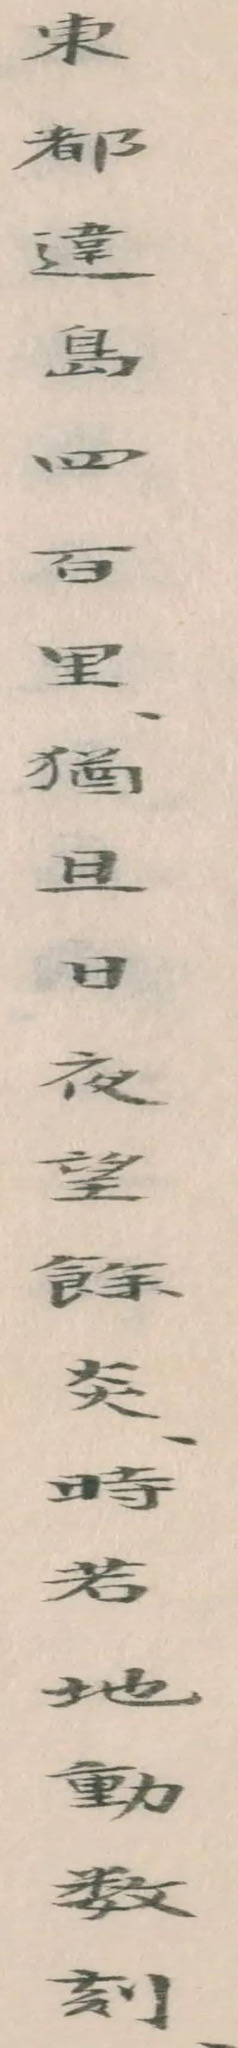東都違島四百里、猶且日夜望余炎、時若地動数刻、
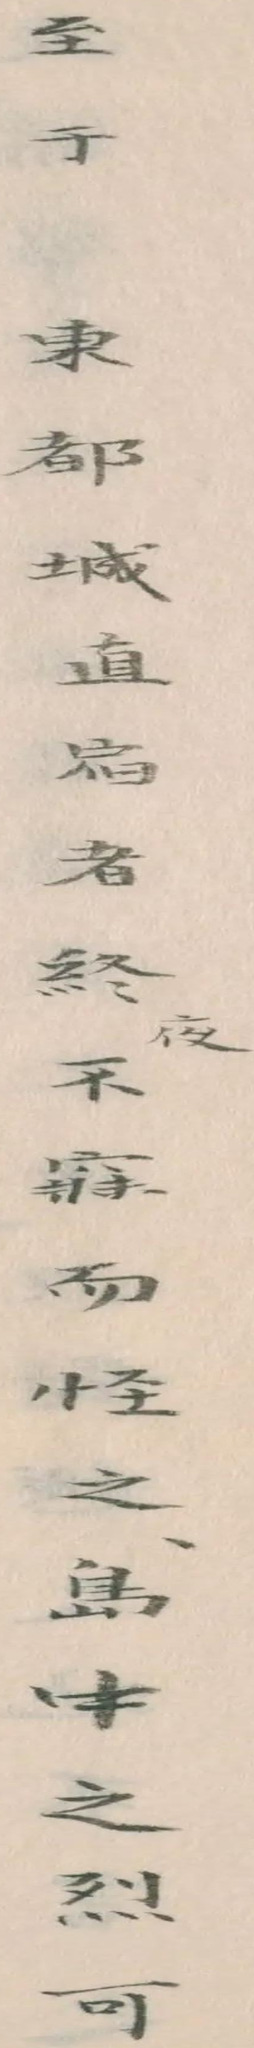至于東都城直宿者終夜不寝而怪之、島中之烈可
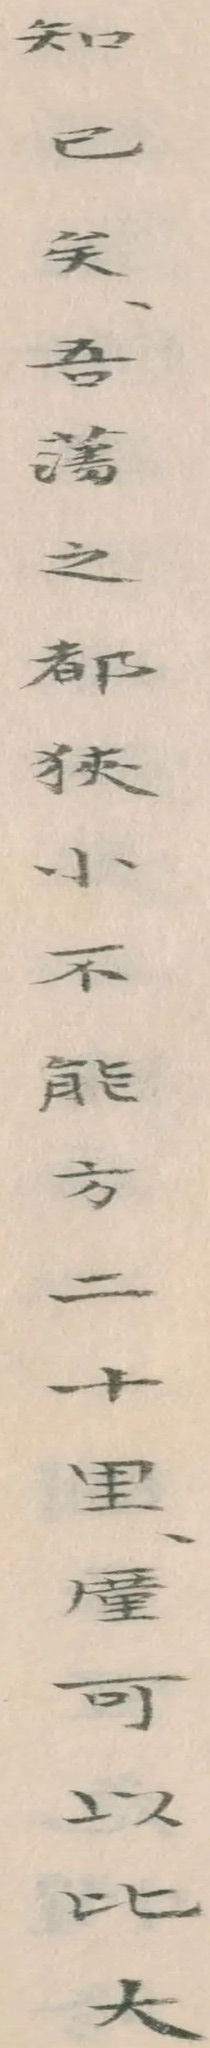知己矣、吾藩之都狭小不能方二十里、厪可以比大
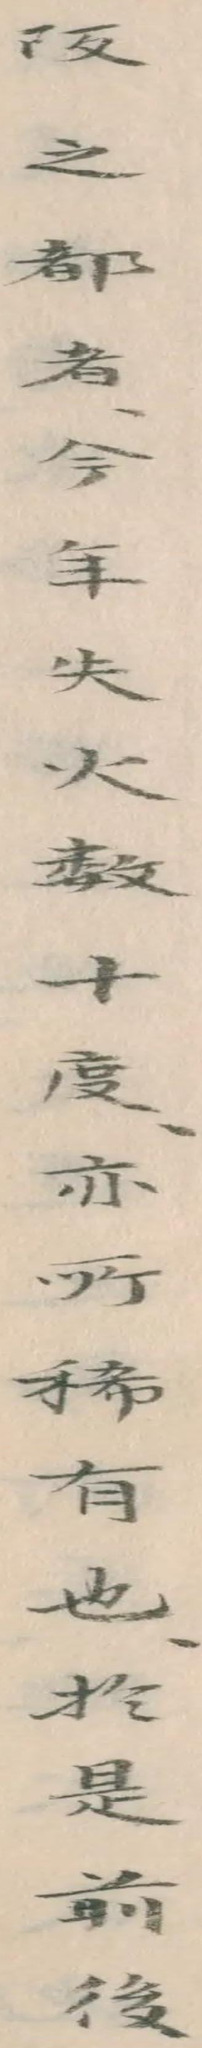阪之都者、今年失火数十度、亦所稀有也、於是前後

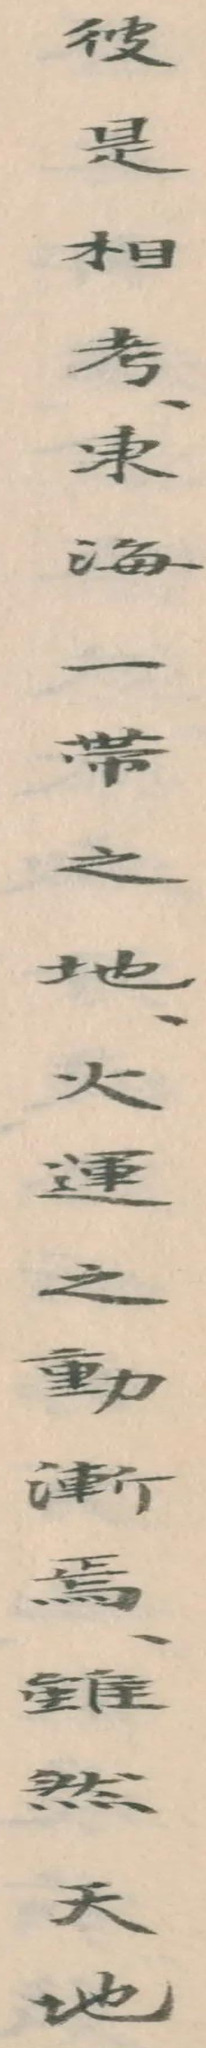彼是相考、東海一帯之地、火運之動漸焉、雖然天地
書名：地災撮要. 巻11-12(地震之部)
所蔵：国立国会図書館 National Diet Library, JAPAN
